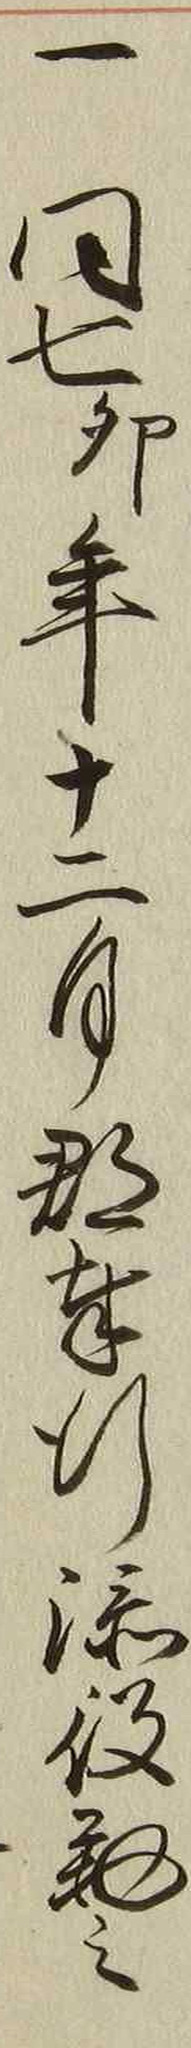一同七卯年十二月郡奉行添役勤之
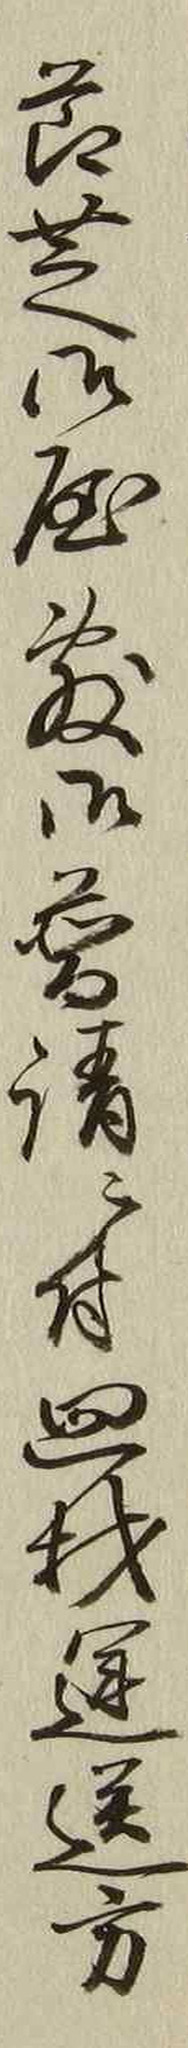節芝御屋敷御晋請ニ付廻材運送方
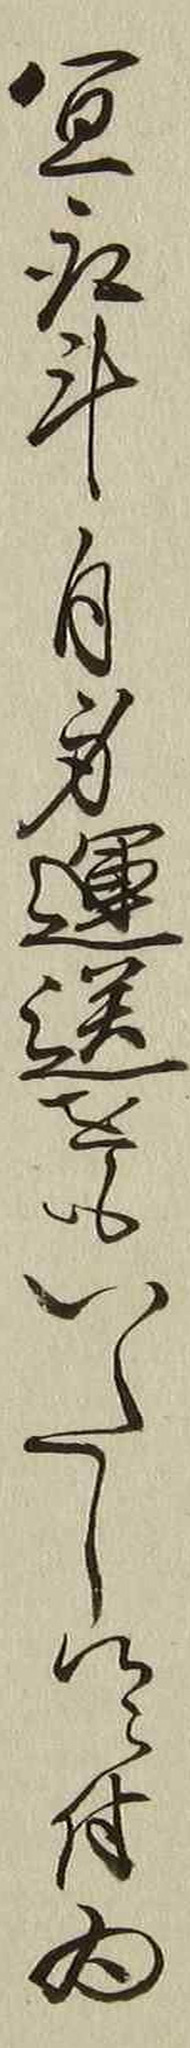宜取斗自身運送をもいたし候ニ付為
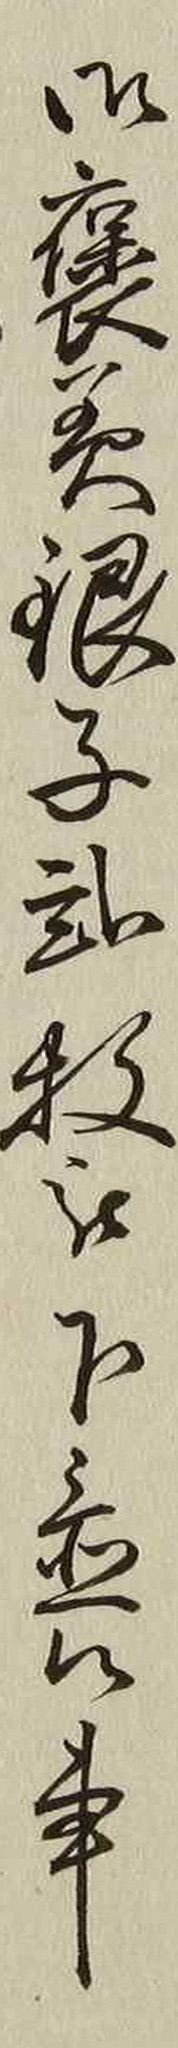御褒美銀子弐枚被下置候事
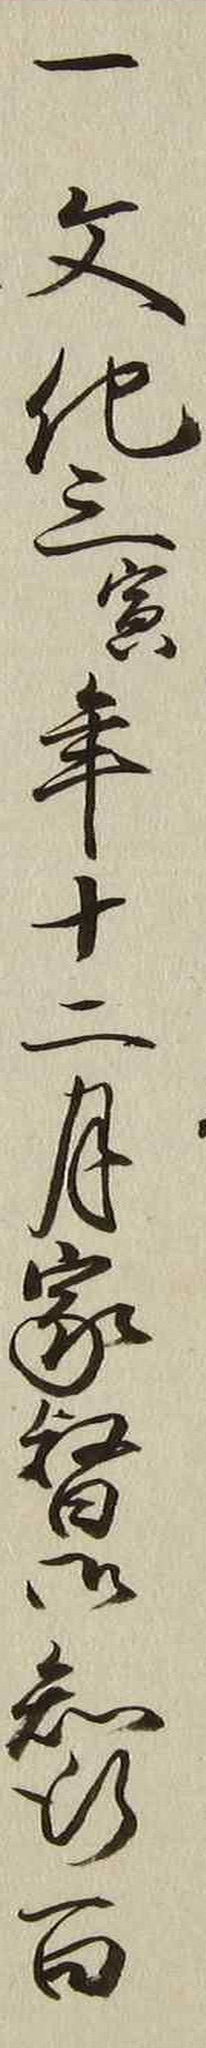一文化三寅年十二月家督御知行百
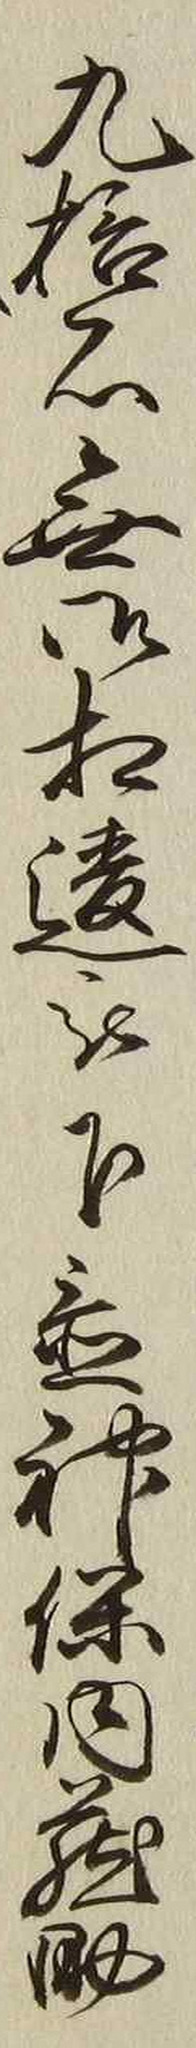九拾石無御相違被下置神保内蔵助
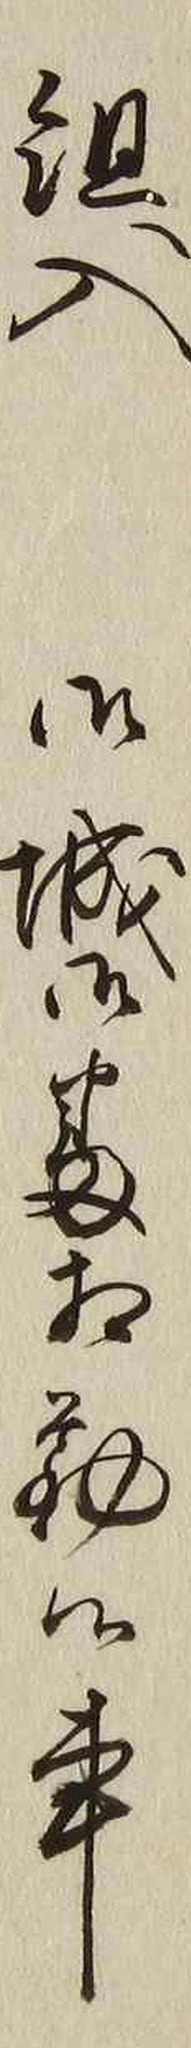組へ入御城御番相勤候事
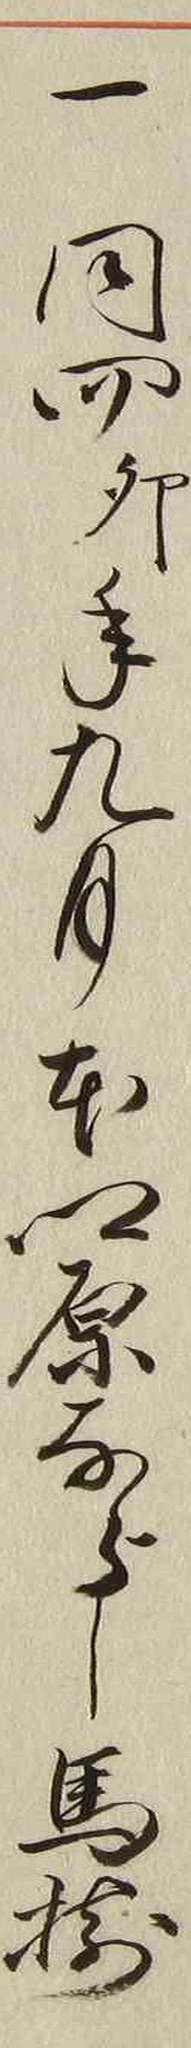一同四卯年九月本郷原ならし馬揃
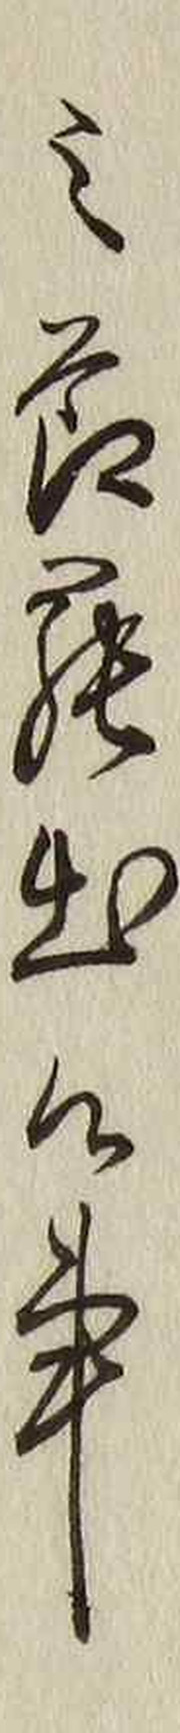之節罷出候事
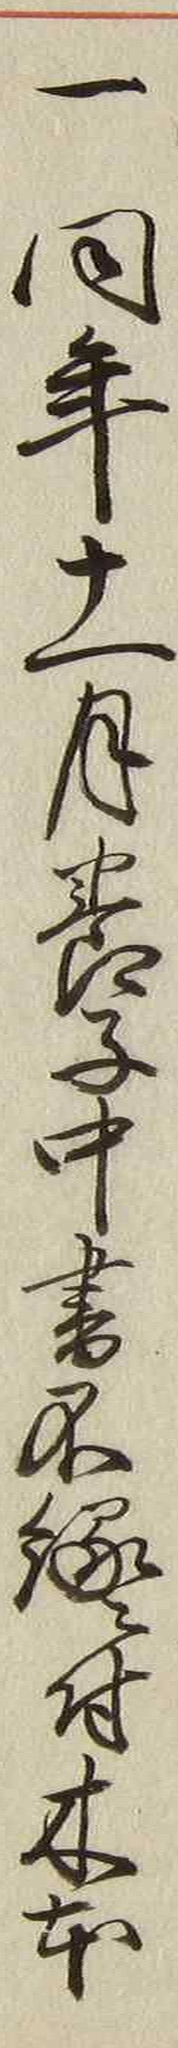一同年十一月養子中書不縁ニ付木本
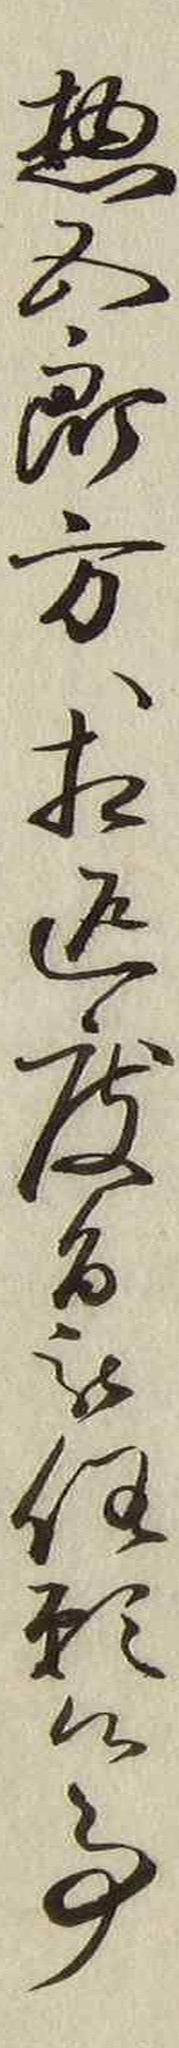惣五郎方へ相返度旨被任願候事
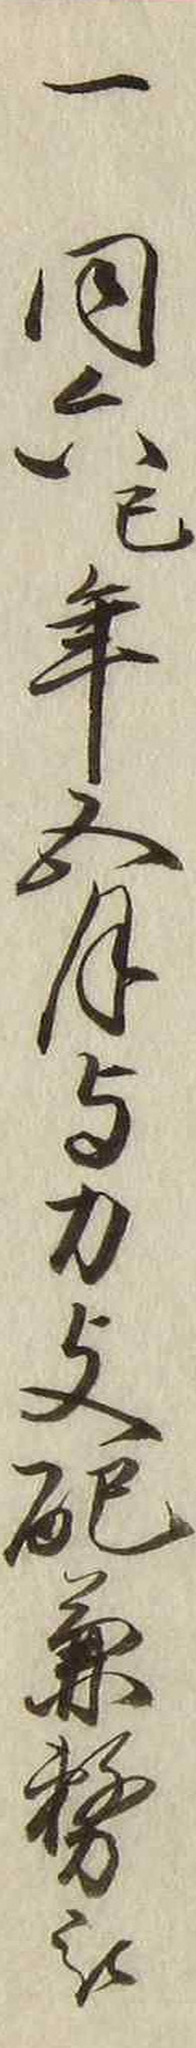一同六巳年五月与力支配兼務被
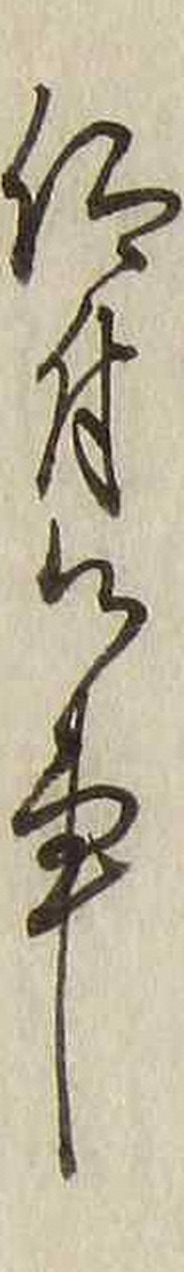仰付候事

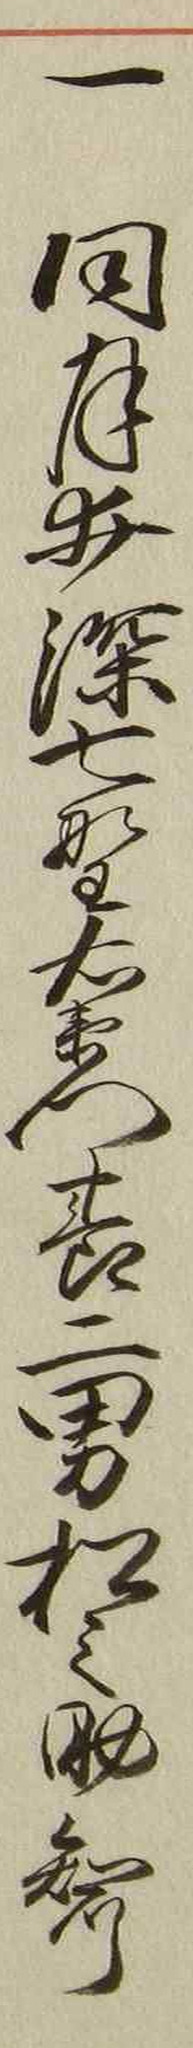一同月井深七野右衛門養二男松之助聟
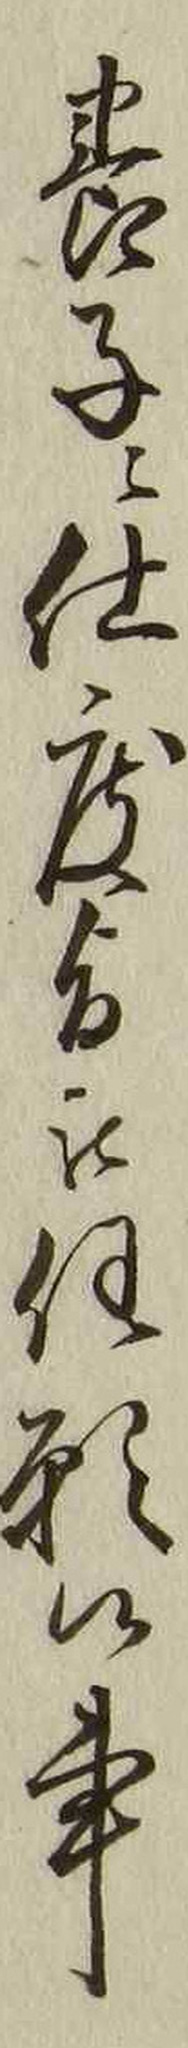養子ニ仕度旨被任願候事
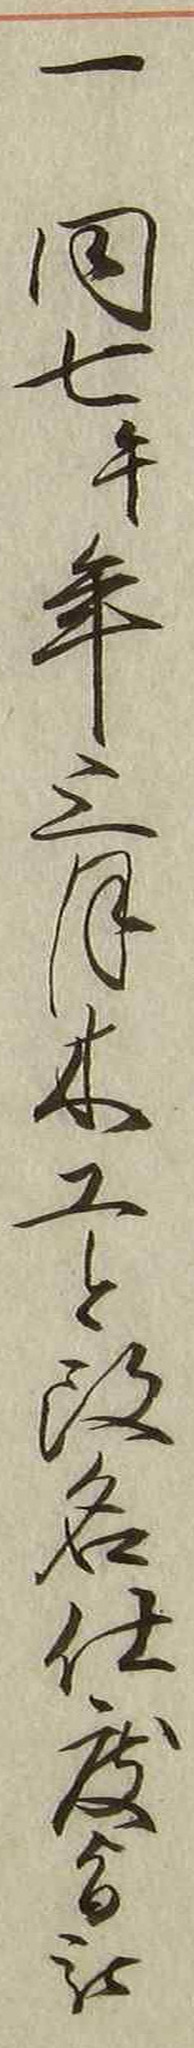一同七午年三月木工と改名仕度旨被
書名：諸士系譜　巻之21　い之部21
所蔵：会津若松市立会津図書館
